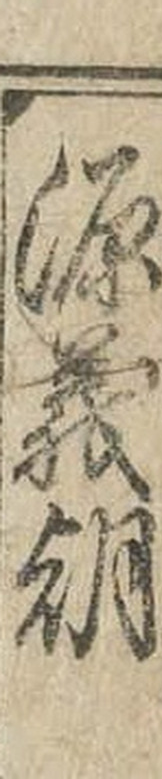源義朝
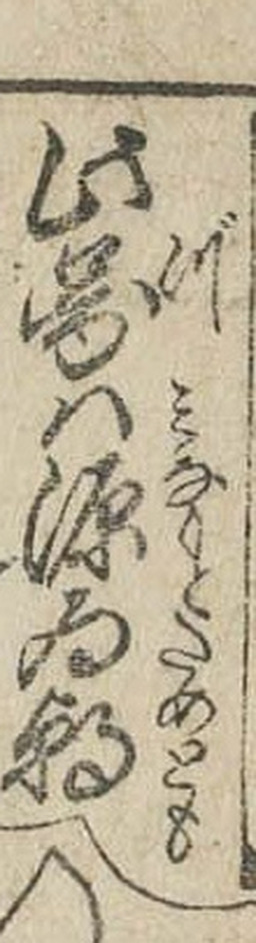此図は源為朝
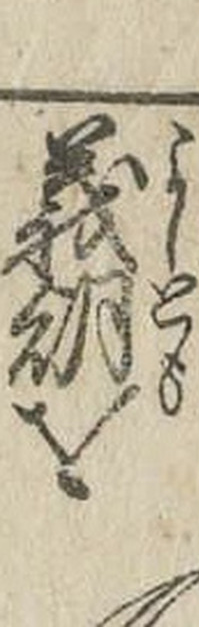義朝を
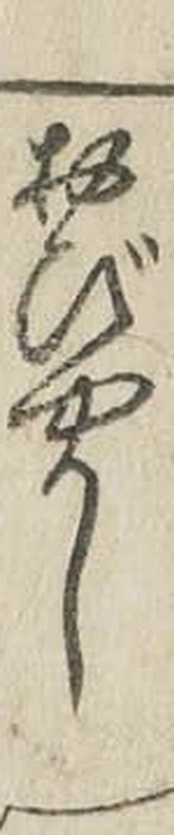おびやかし
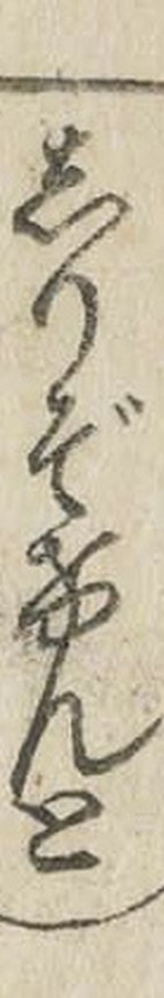しりぞけんと
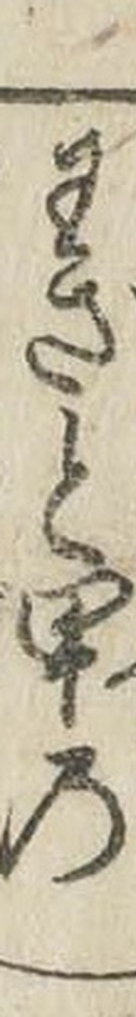わざと甲の
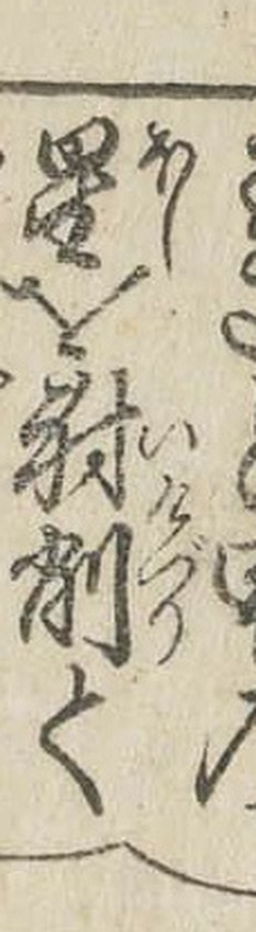星を射削て
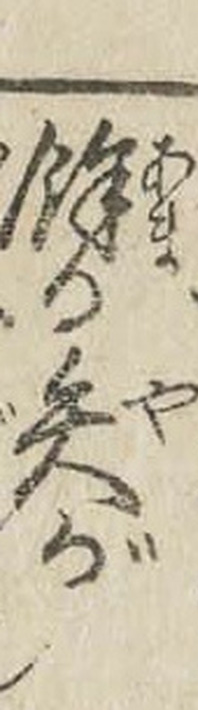余る矢が
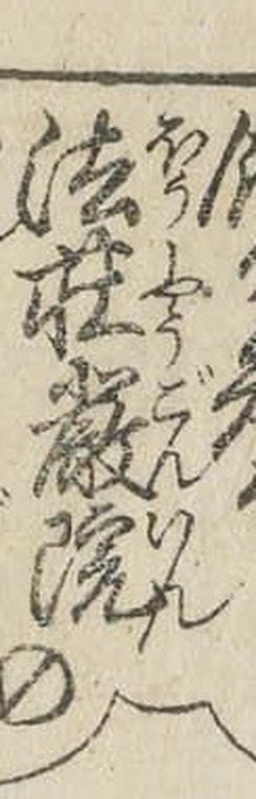法荘厳院の
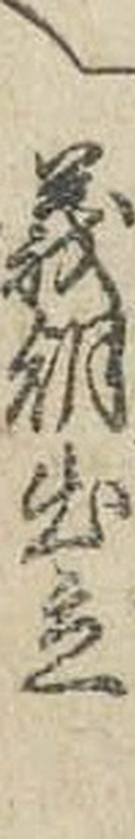義朝出立
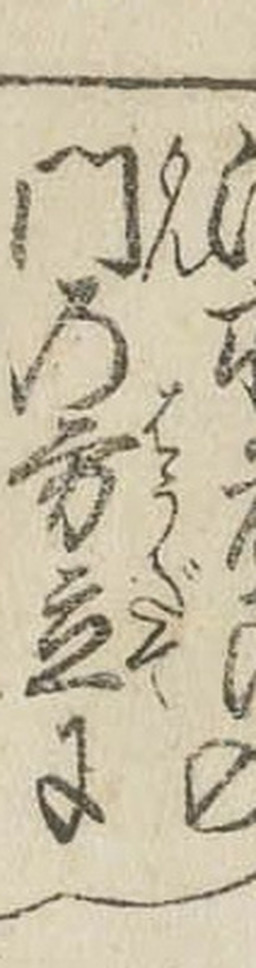門の方立に
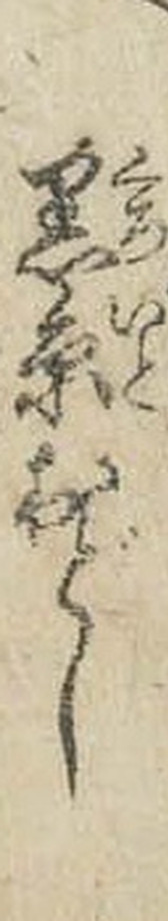黒糸おどし
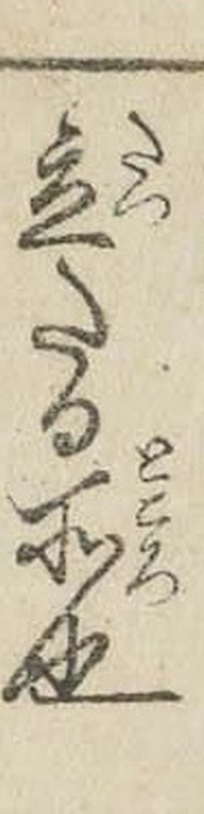立たる所也
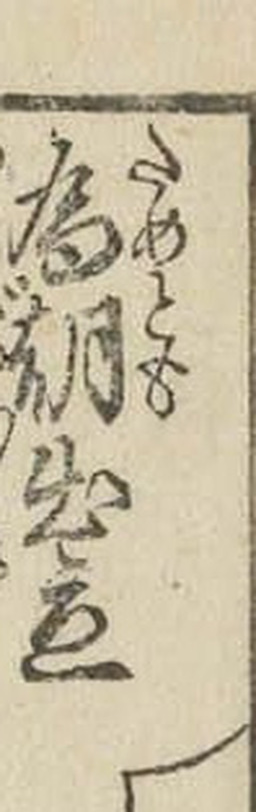為朝出立
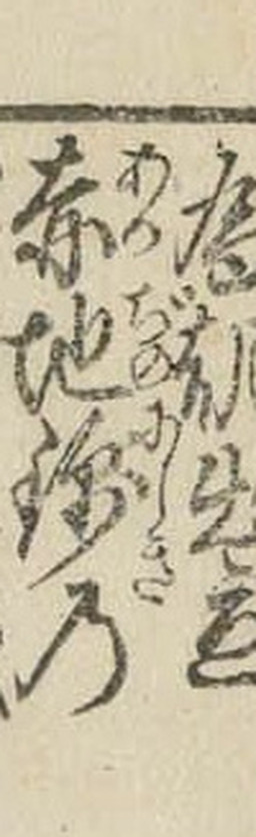赤地錦の
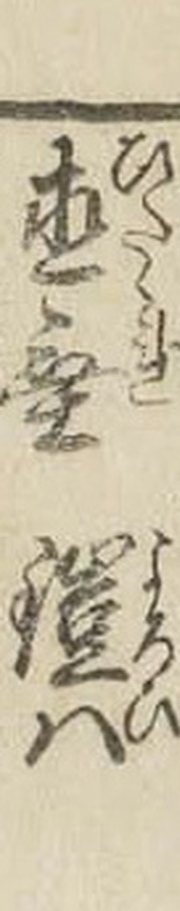直垂鎧は
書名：絵本写宝袋 9巻 3之巻
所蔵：東京学芸大学教育コンテンツアーカイブ
